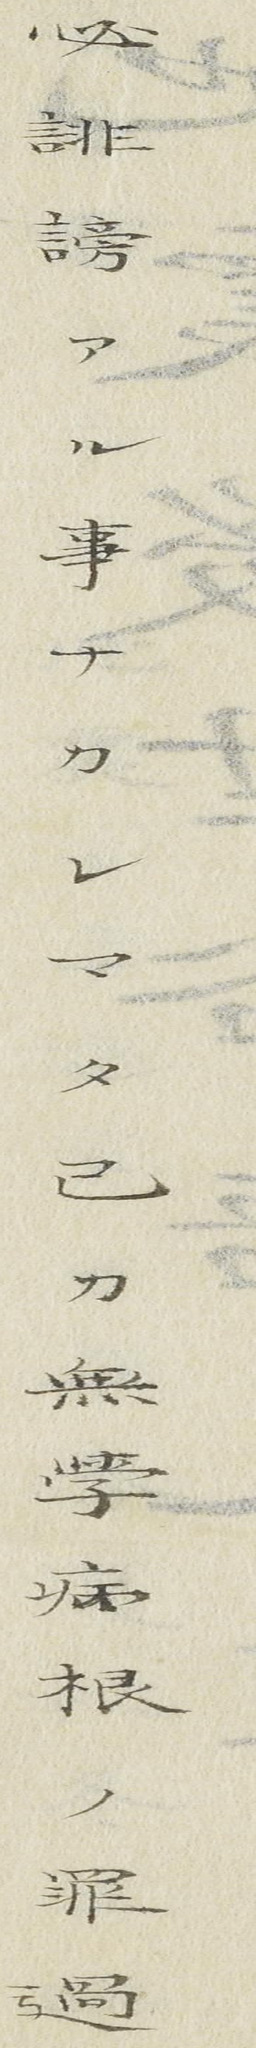必誹謗アル事ナカレマタ己カ無学病根ノ罪過
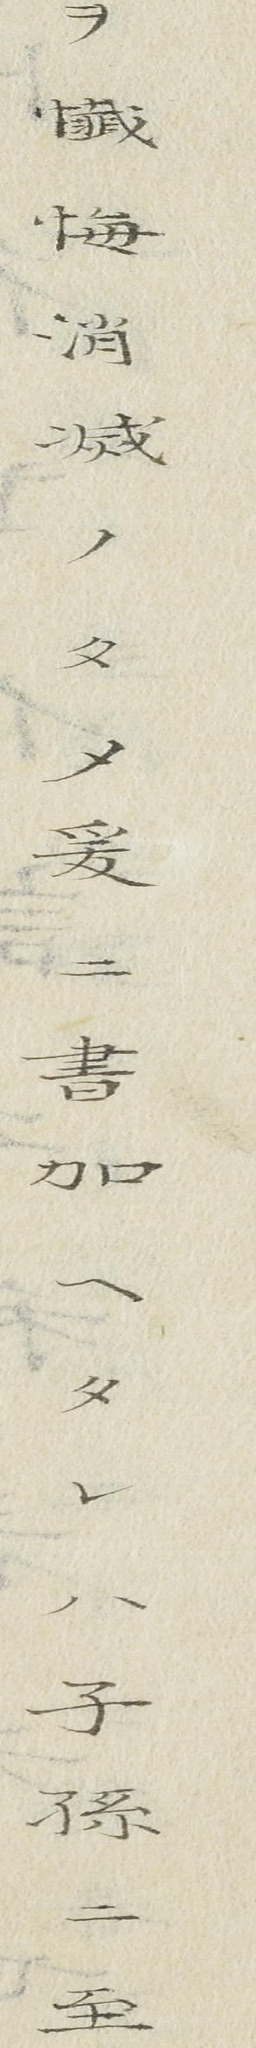ヲ懺悔消滅ノタメ爰ニ書加ヘタレハ子孫ニ至
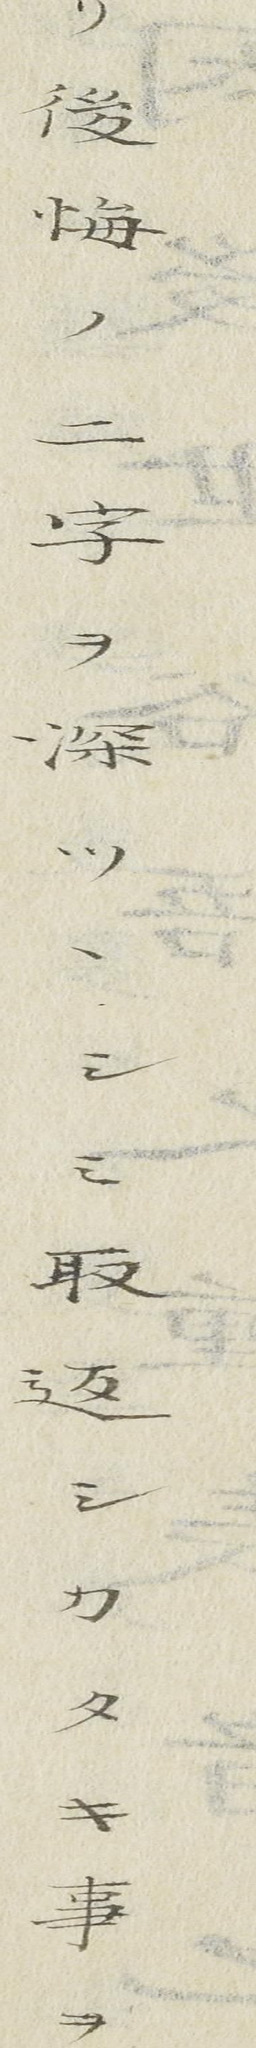リ後悔ノ二字ヲ深ツヽシミ取返シカタキ事ヲ
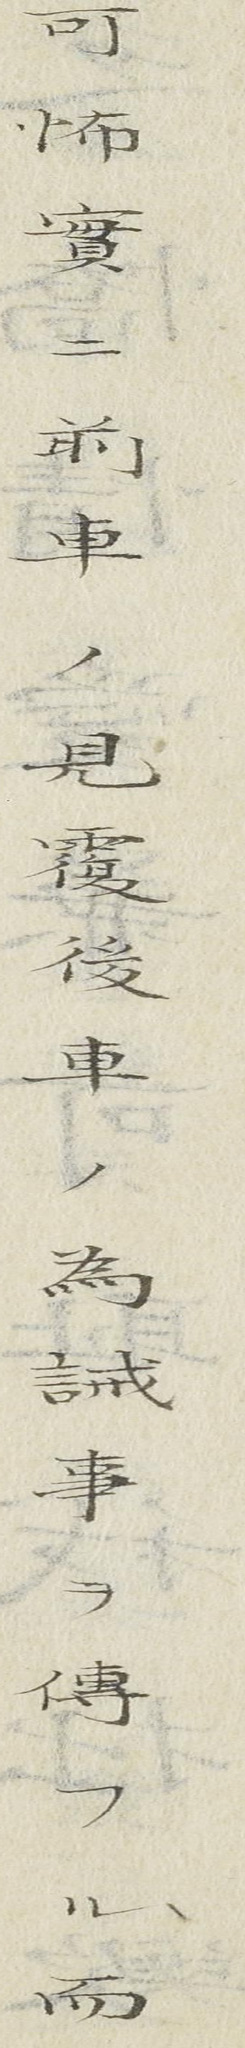可怖実ニ前車ノ見覆後車ノ為誡事ヲ伝フル而
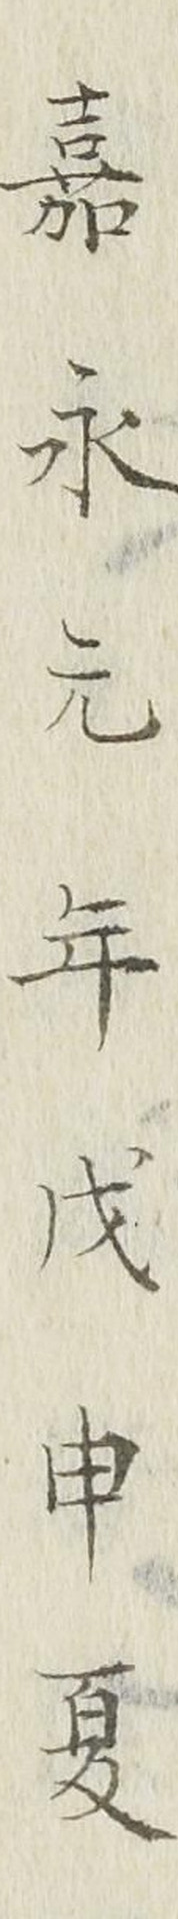嘉永元年戌申夏

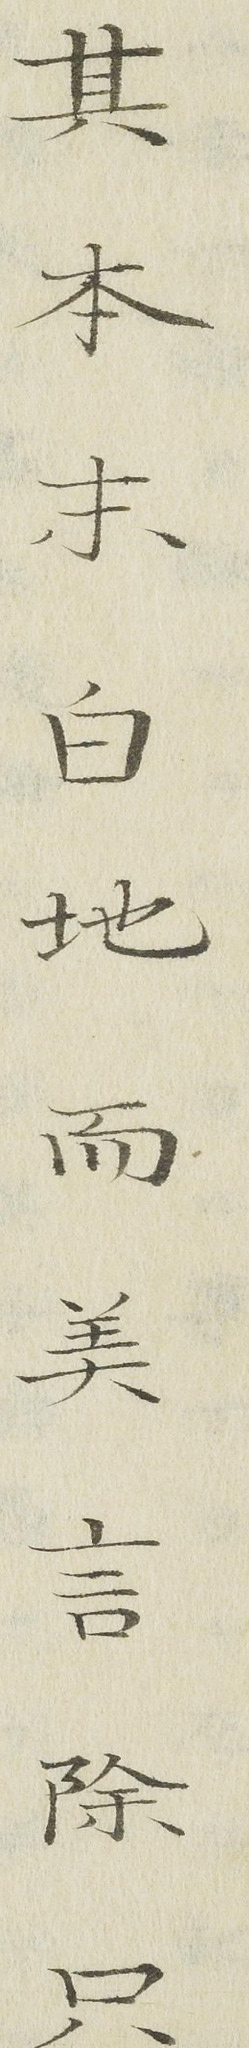其本末白地而美言除只
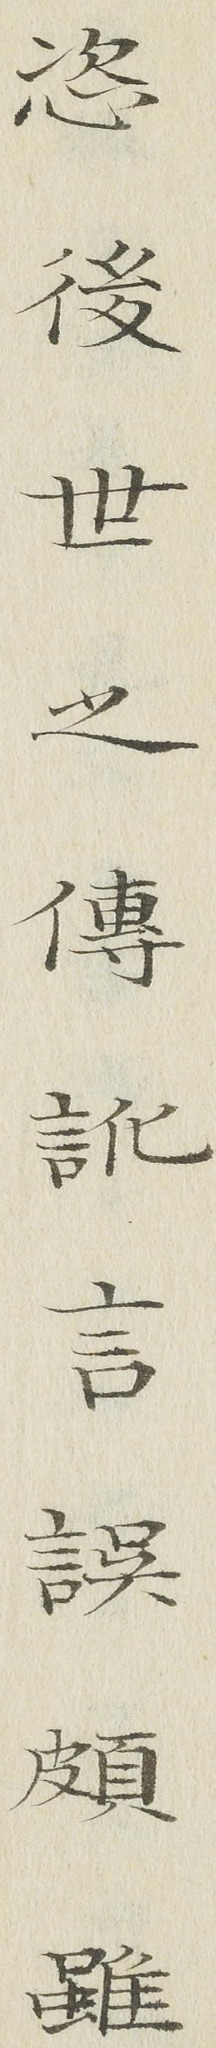恣後世之伝訛言誤頗雖
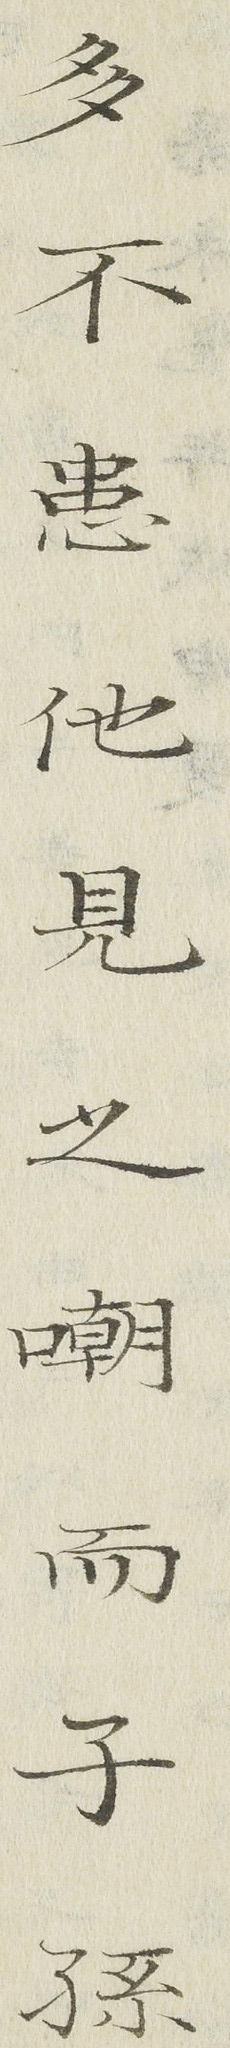多不患他見之嘲而子孫
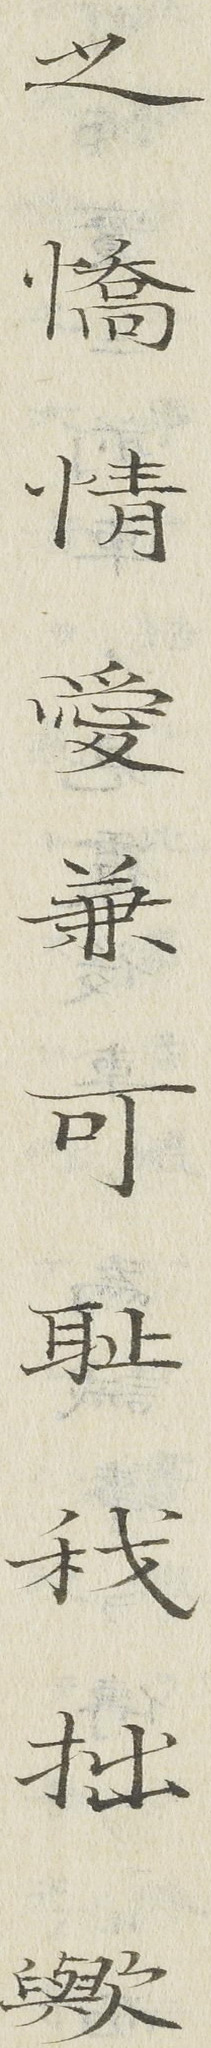之憍情愛兼可恥我拙歟
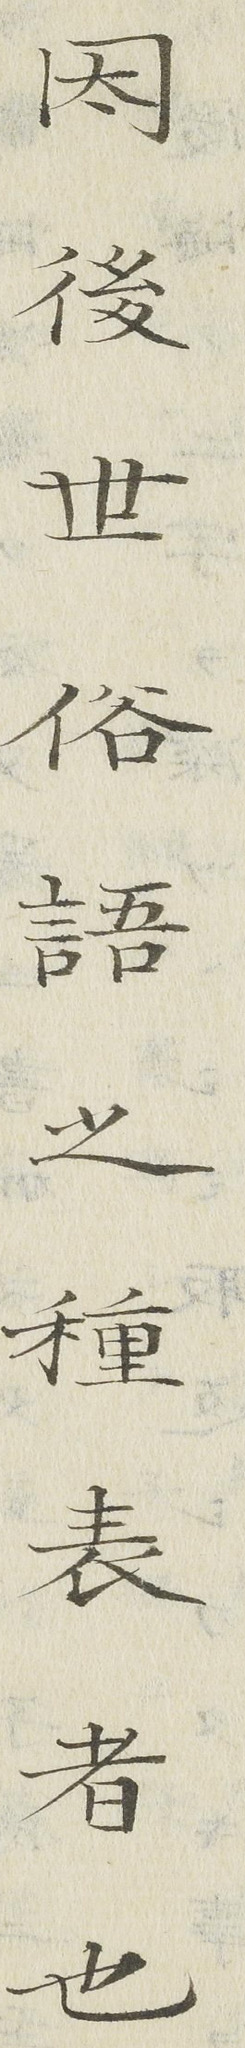因後世俗語之種表者也
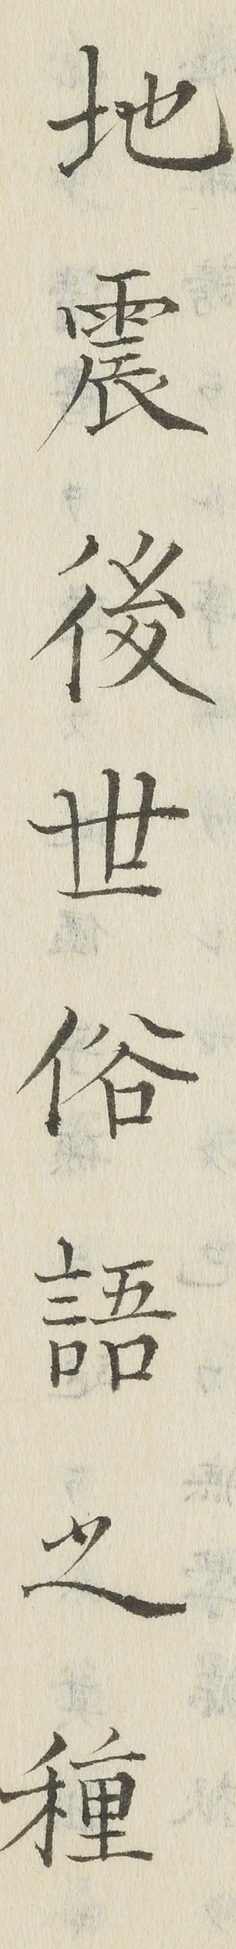地震後世俗語之種
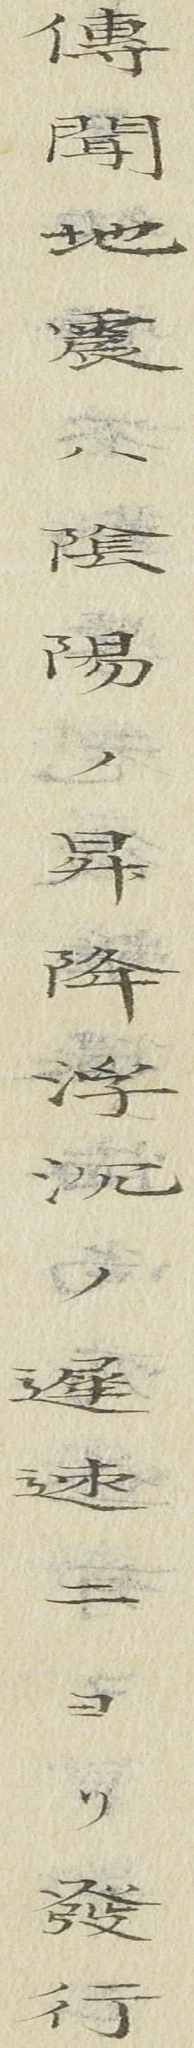伝聞地震ハ陰陽ノ昇降浮沈ノ遅速ニヨリ発行
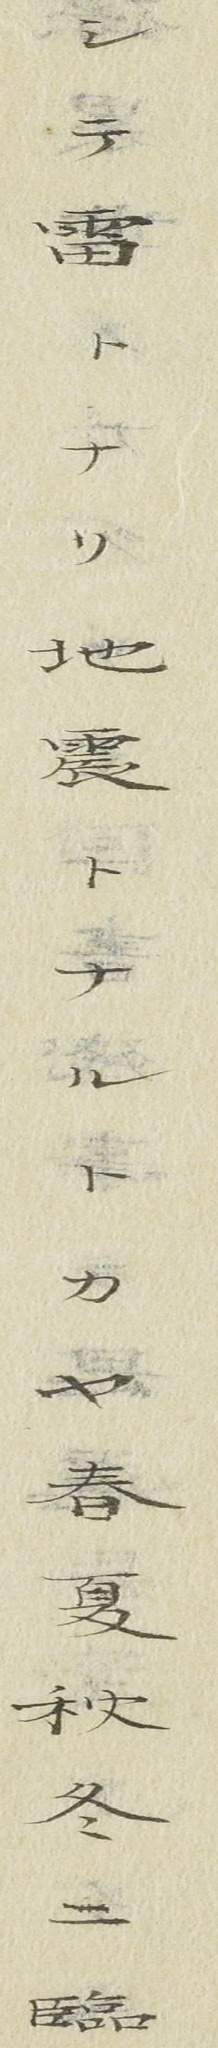シテ雷トナリ地震トナルトカヤ春夏秋冬ニ臨
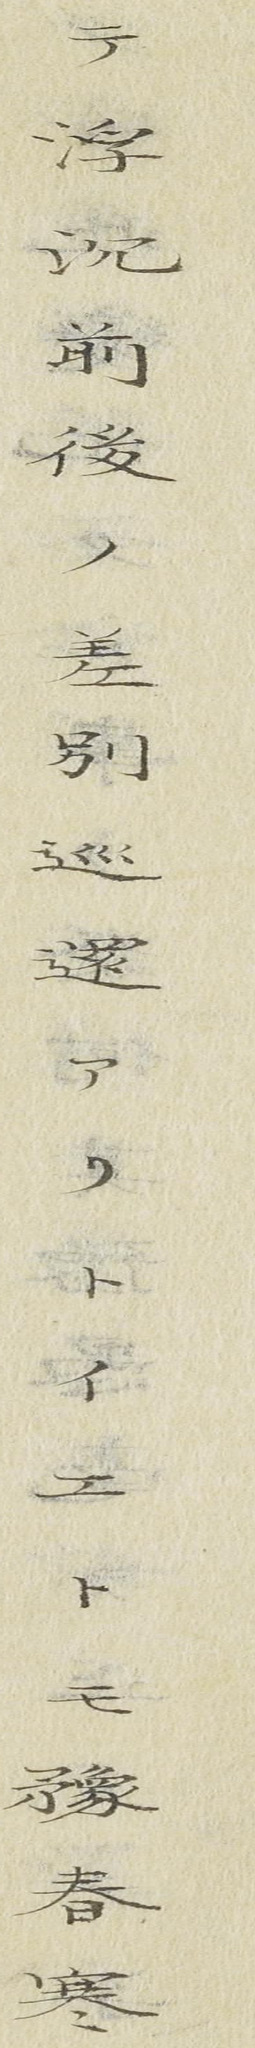テ浮沈前後ノ差別巡還アリトイエトモ予春寒
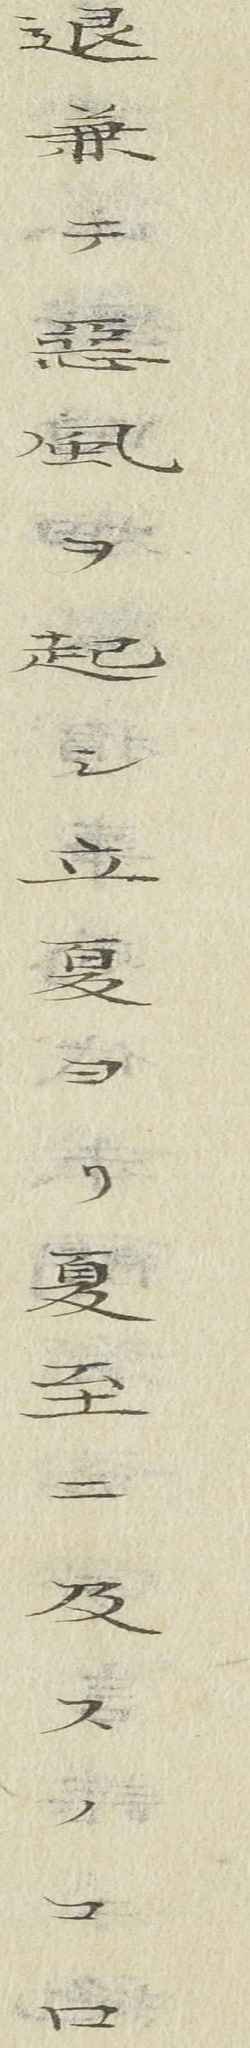退兼テ悪風ヲ起シ立夏ヨリ夏至ニ及スノコロ
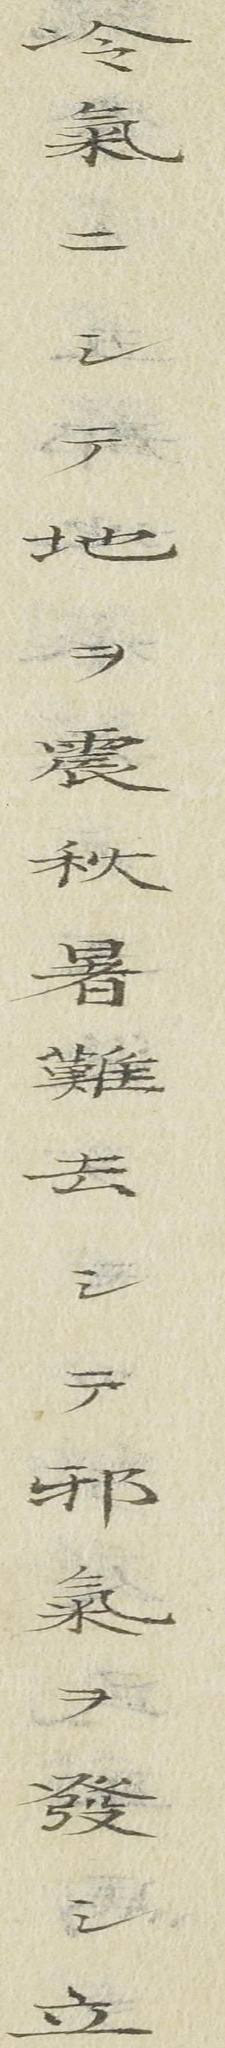冷気ニシテ地ヲ震秋暑難去シテ邪気ヲ発シ立
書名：地災撮要　地震之部　巻ノ二
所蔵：東京大学地震研究所図書室 Earthquake Research Institute Library, The University of Tokyo, JAPAN
